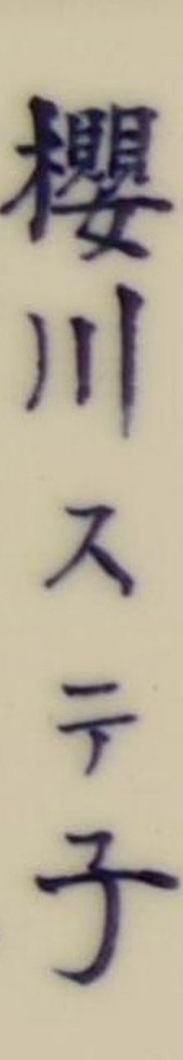桜川ステ子
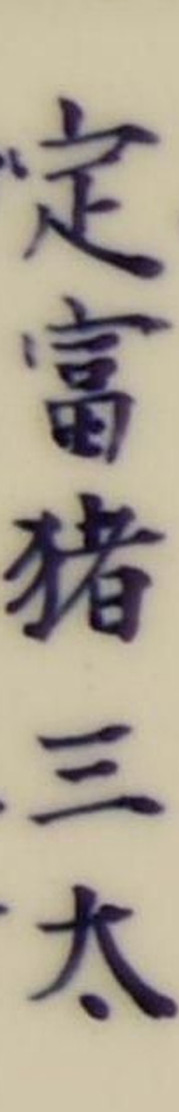定富猪三太
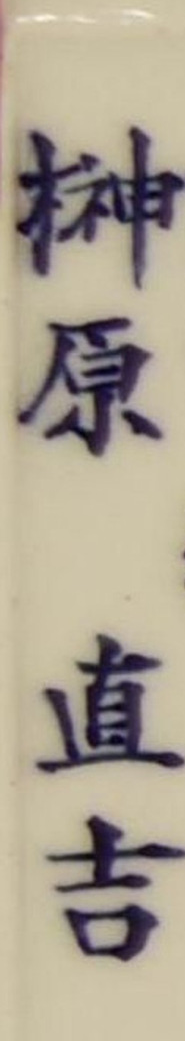榊原直吉

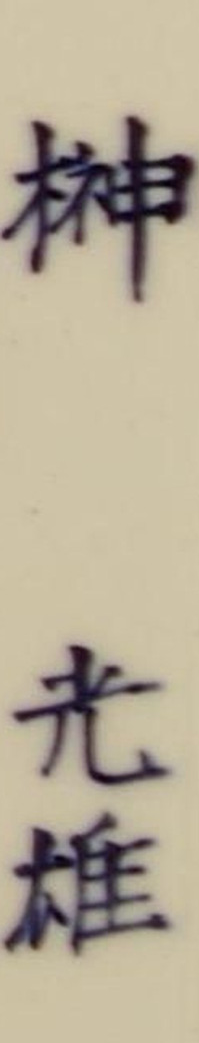榊光雄
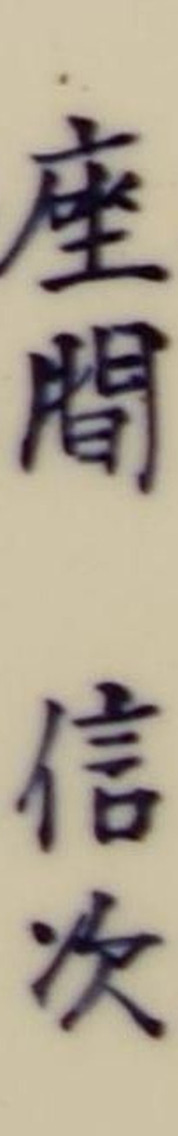座間信次
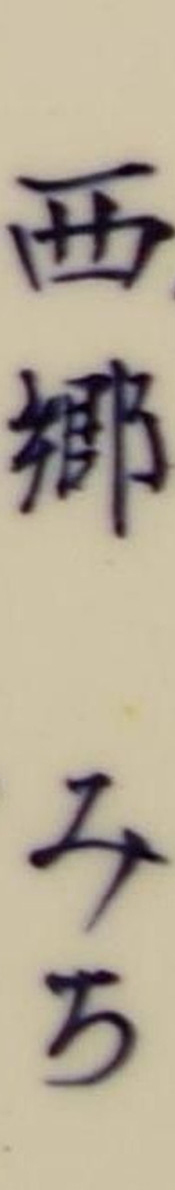西郷みち
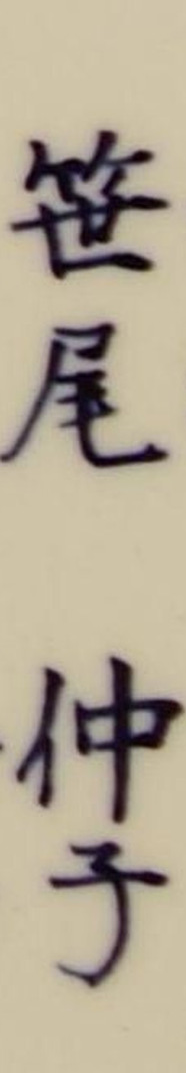笹尾仲子
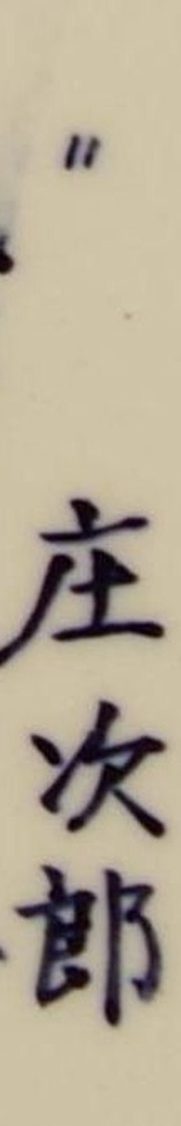庄次郎
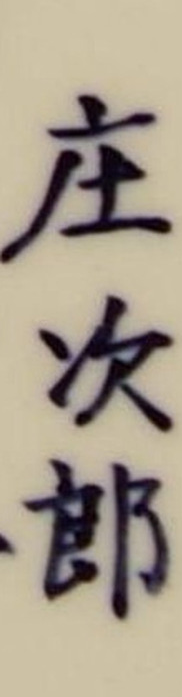庄次郎
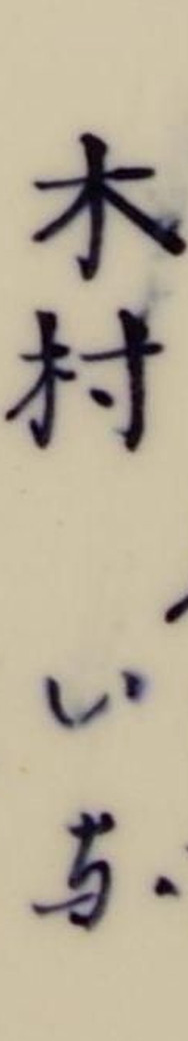木村いな
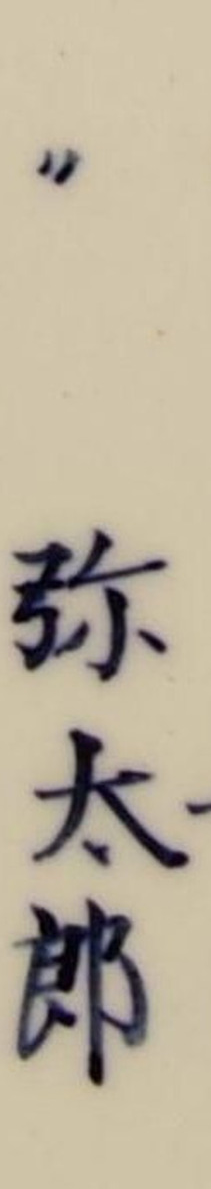弥太郎
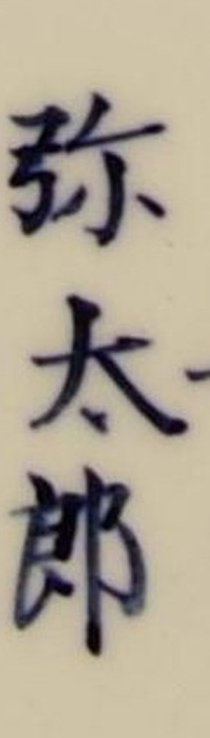弥太郎
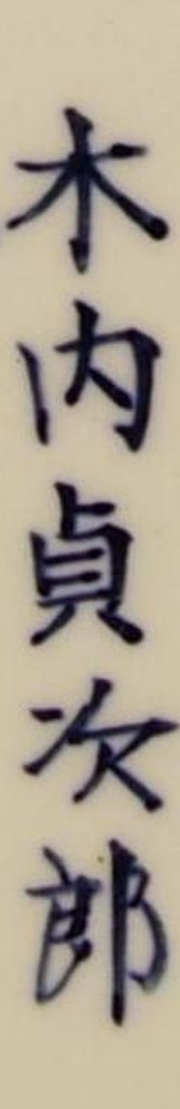木内貞次郎
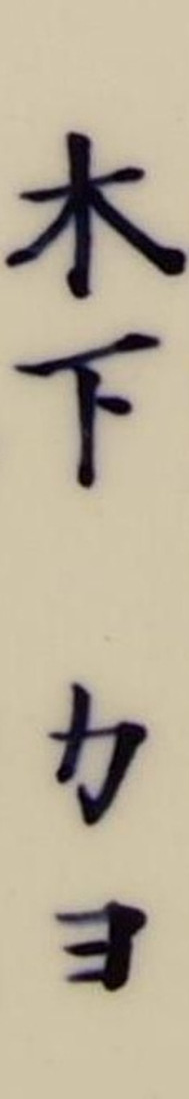木下カヨ
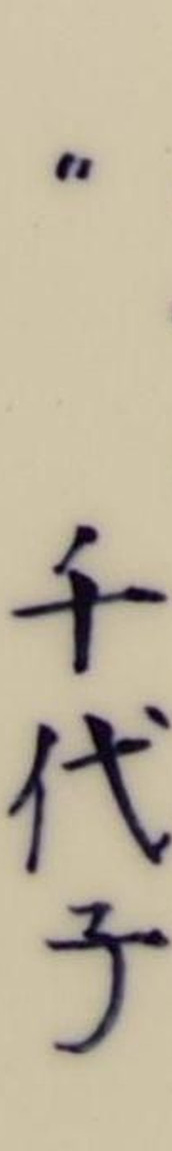千代子
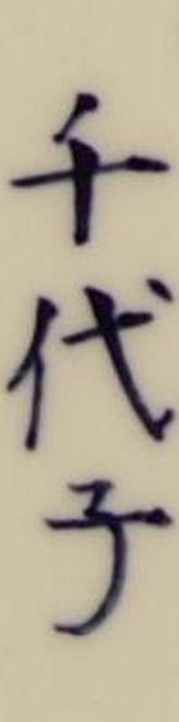千代子
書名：E~L
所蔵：高野山金剛峯寺
